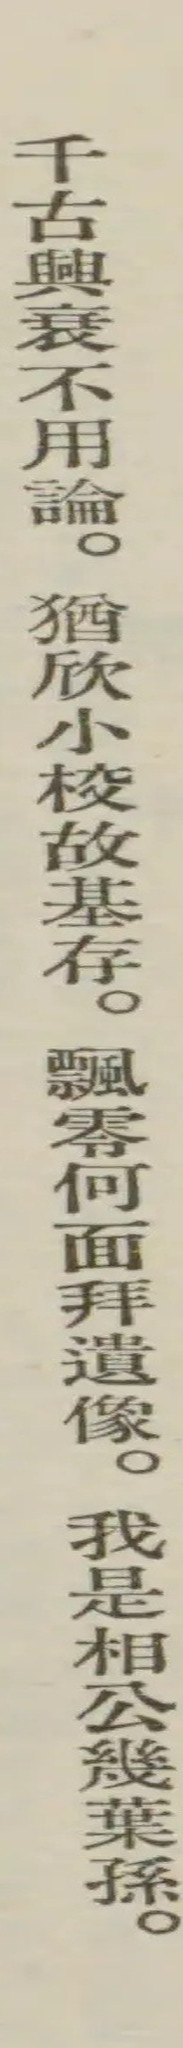千古興衰不用論。猶欣小校故基存。飄零何面拝遺像。我是相公幾葉孫。
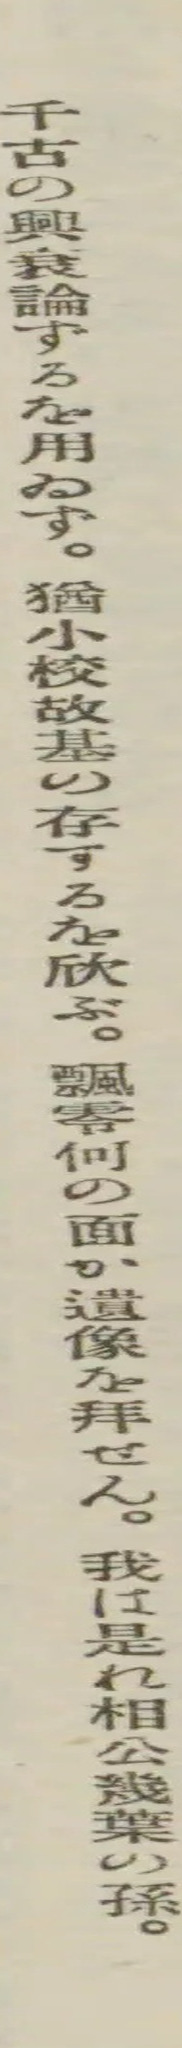千古の興衰論ずるを用ゐず。猶小校故基の存ずるを欣ぶ。飄零何の面か遺像を拝せん。我は是れ相公幾葉の孫。
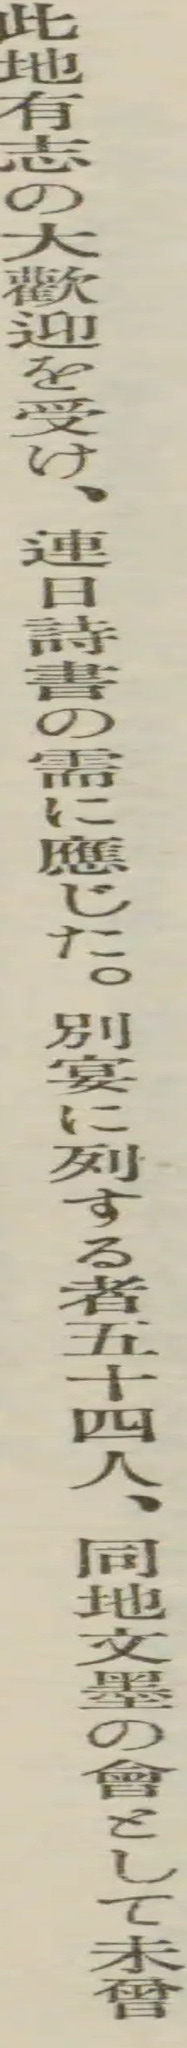此地有志の大歓迎を受け、連日詩書の需に応じた。別宴に列する者五十四人、同地文墨の会として未曾
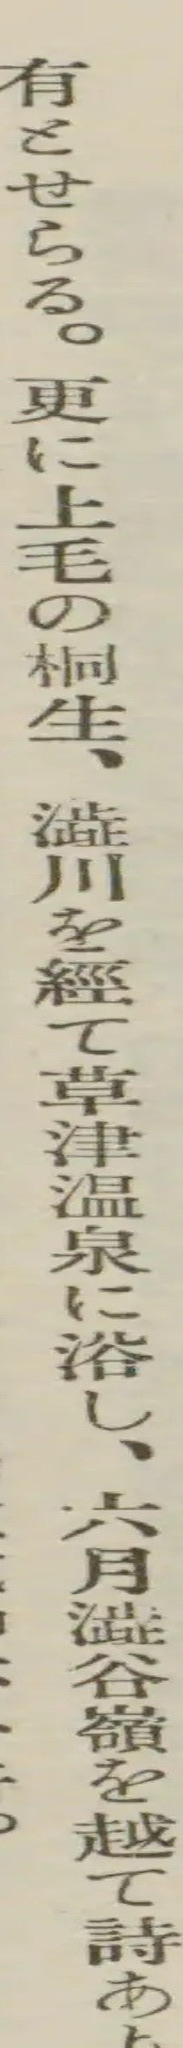有とせらる。更に上毛の桐生、澁川を経て草津温泉に浴し、六月澁谷嶺を越て詩あり。
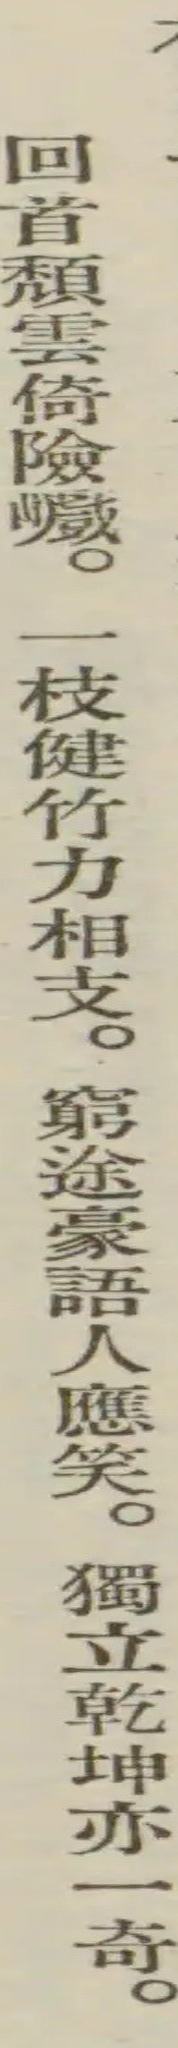回首頽雲倚險巇。一枝健竹力相支。窮途豪語人應笑。獨立乾坤亦一奇。

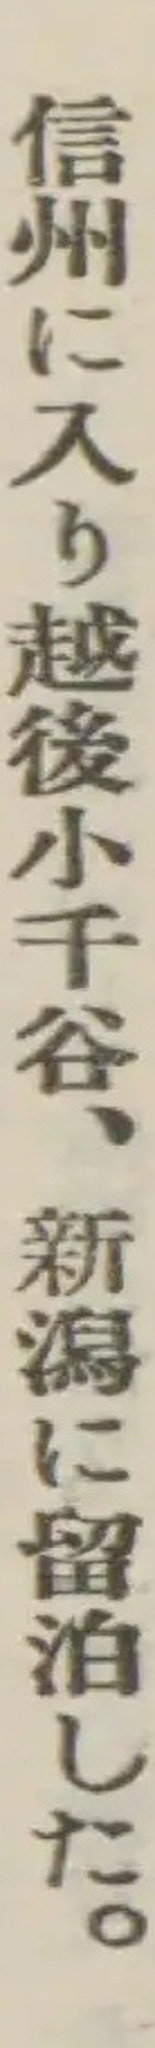信州に入越後小千谷、新潟に留泊した。
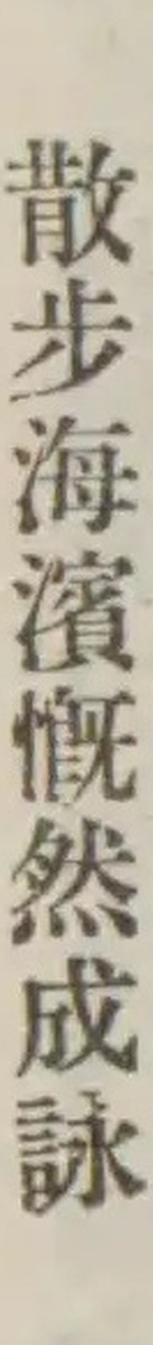散歩海浜慨然成詠
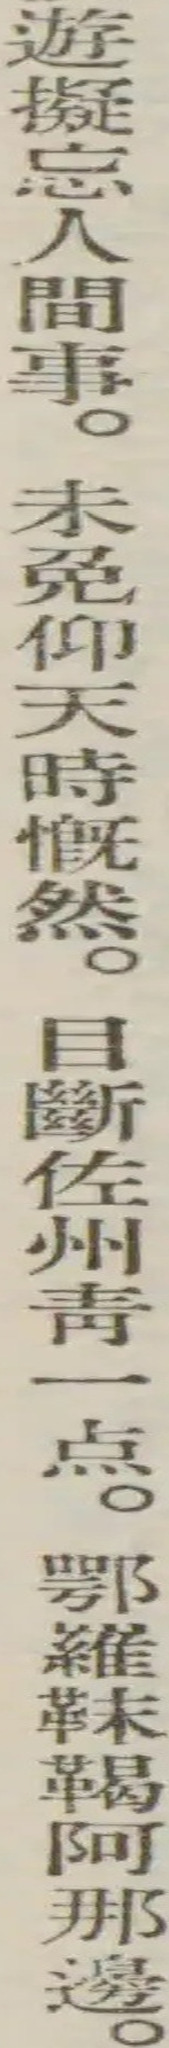漫遊擬忘人間事。未免仰天時慨然。目斷佐州青一点。鄂羅靺鞨阿那邊。
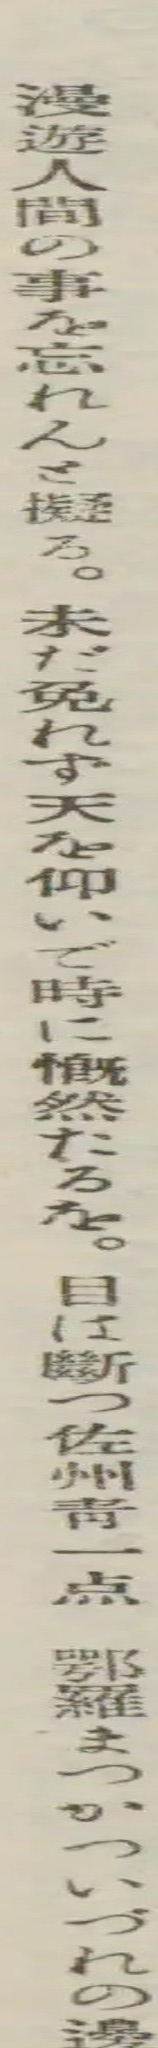漫遊人間の事を忘れんと擬る。未だ免れず天を仰いで時に慨然たるを。目は絶つ佐州青一点。鄂羅まつかついづれの辺ぞ。
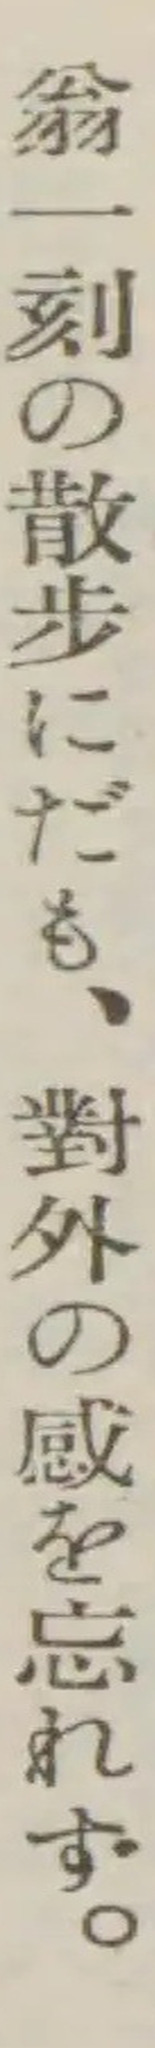翁一刻の散歩にだも、対外の感を忘れず。
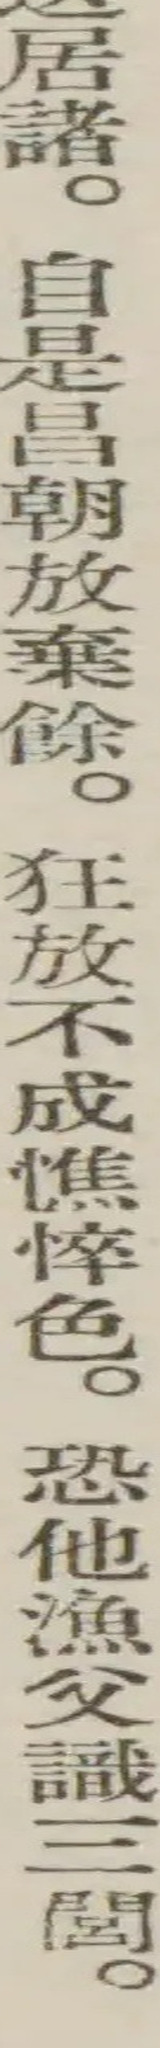酔中随處送居諸。自是昌朝放棄餘。狂放不成憔悴色。恐他漁父識三閭。
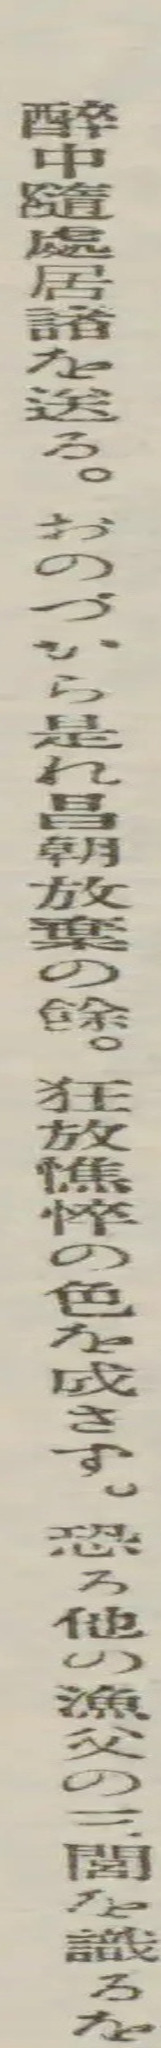酔中随処居諸を送る。おのづから是れ昌朝放棄の余。狂放憔悴の色を成さず。恐る他の漁父の三閭を識るを。
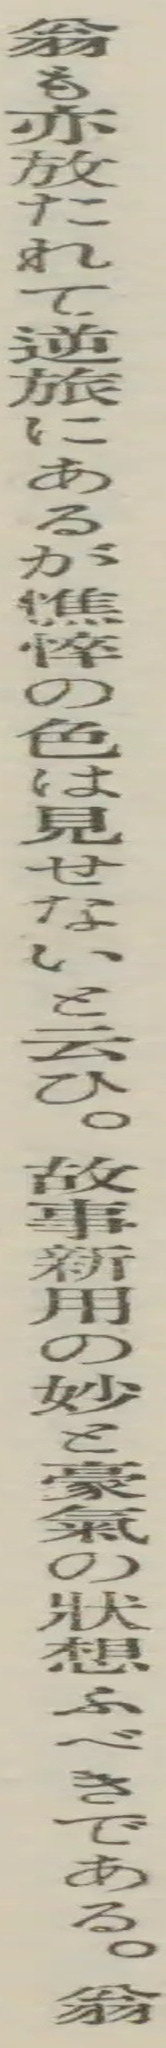翁も亦放たれて逆旅にあるが憔悴の色は見せないと云ひ。故事新用の妙と豪気の状想ふべきである。翁
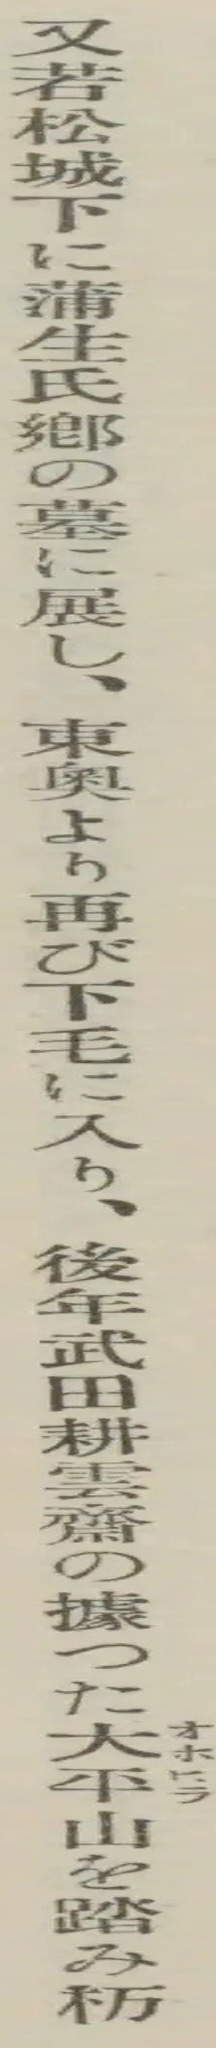又若松城下に蒲生氏郷の墓に展し、東奥より再び下毛に入り、後年武田耕雲齋の拠つた大平山を踏み杤
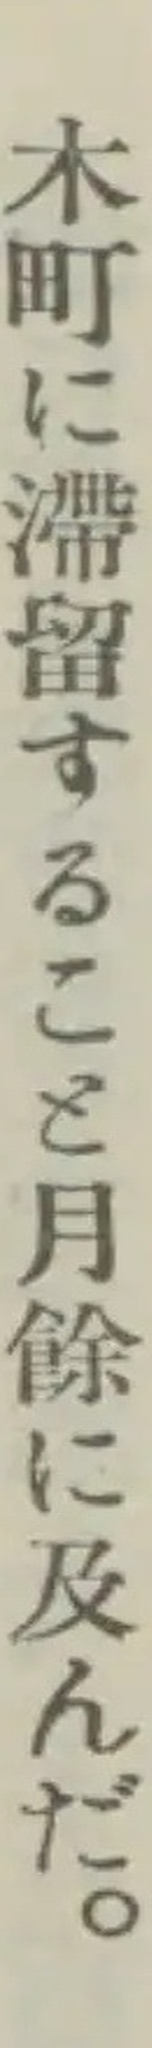木町に滞留すること月余に及んだ。
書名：小野湖山翁小伝
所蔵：国立国会図書館 National Diet Library, JAPAN
